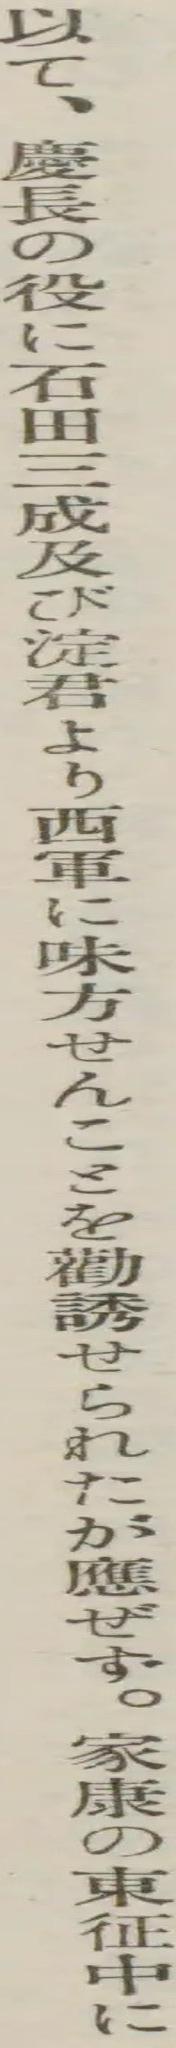以て、慶長の役に石田三成及び淀君より西軍に味方せんことを勧誘せられたが応ぜず。家康の東征中に
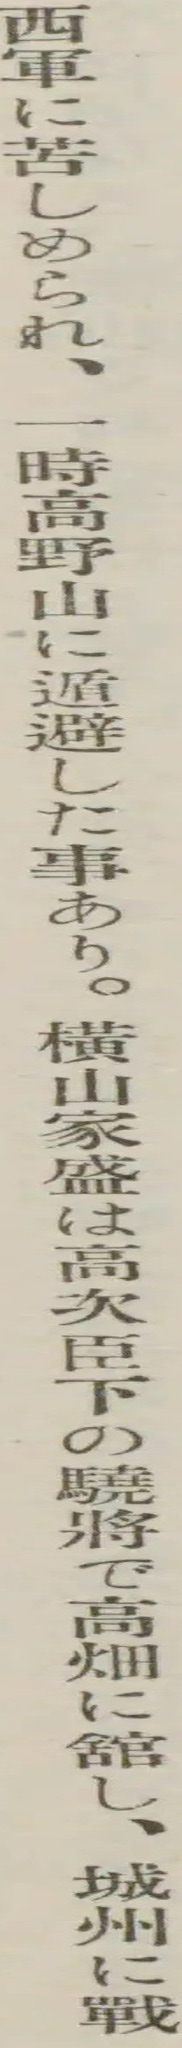西軍に苦しめられ、一時高野山に遁避した事あり。横山家盛は高次臣下の驍将で高畑に館し、城州に戦
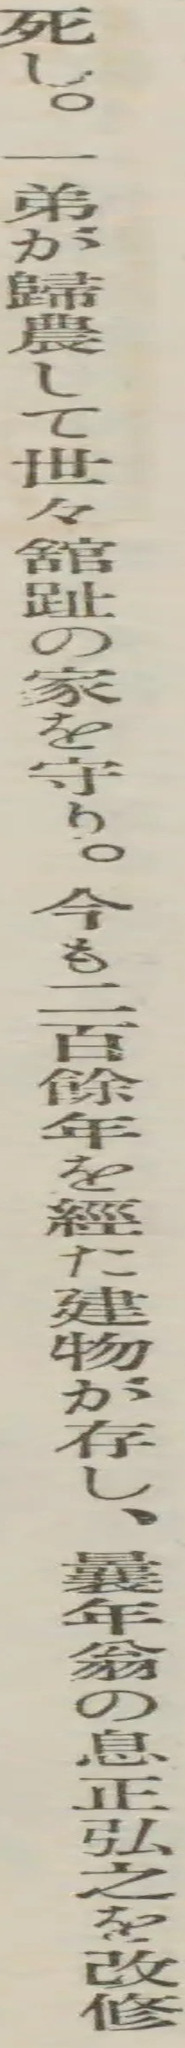死し。一弟が帰農して世々館趾の家をまもり。今も二百余年を経た建物が存し、曩年翁の息正弘之を改修
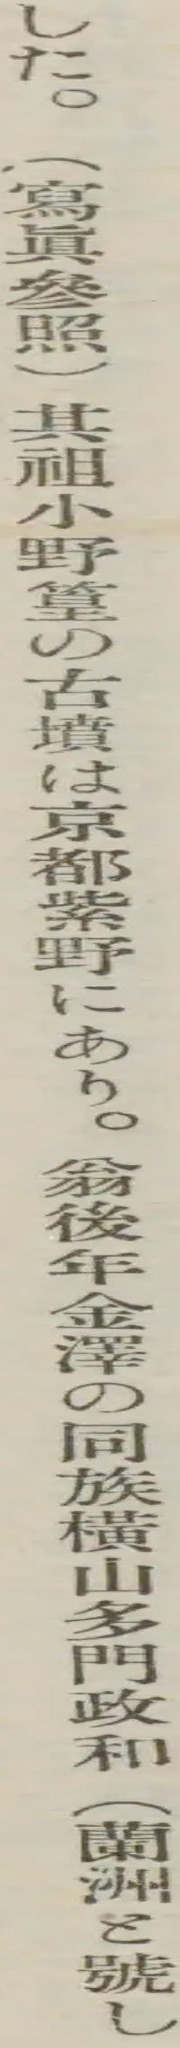した。(写真参照)其祖小野篁の古墳は京都紫野にあり。翁後年金沢の同族横山多門政和(蘭洲と号し
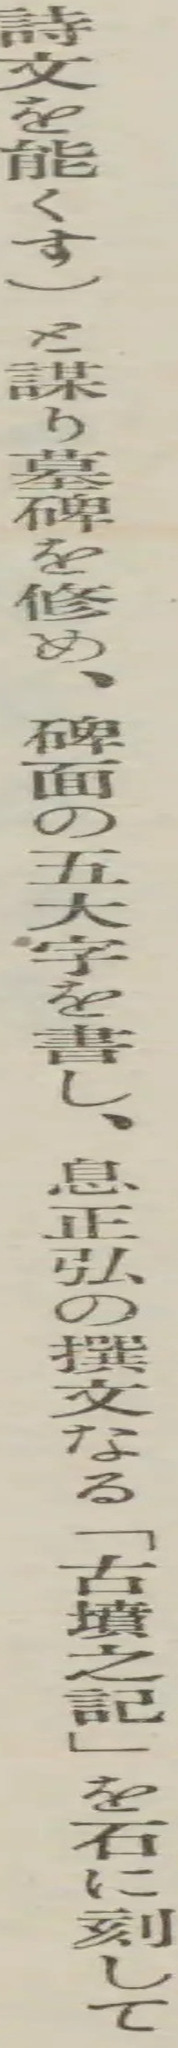詩文を能くす)と謀り墓碑を修め、碑面の五大字を書し、息正弘の撰文なる「古墳之記」を石に刻して
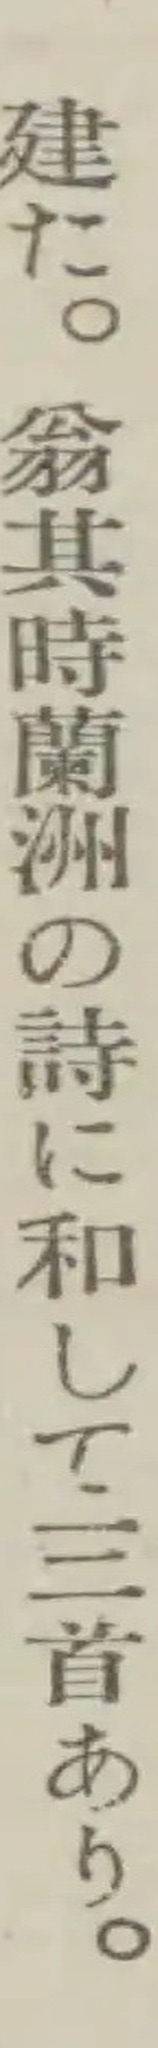建た。翁其時蘭洲の詩に和して三首あり。
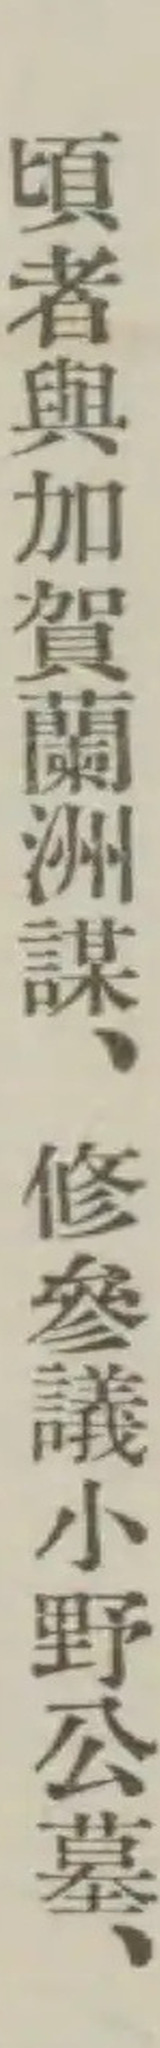頃者与加賀蘭洲謀、修参議小野公墓、
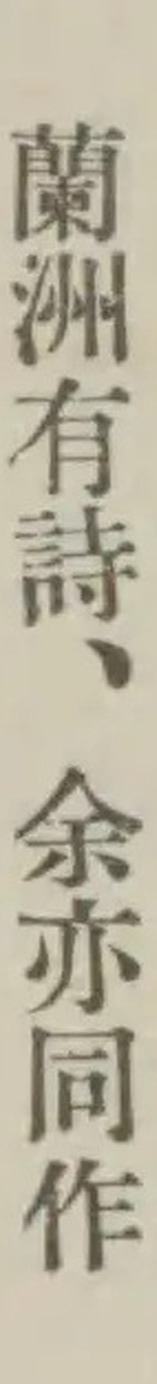蘭洲有詩、余亦同作
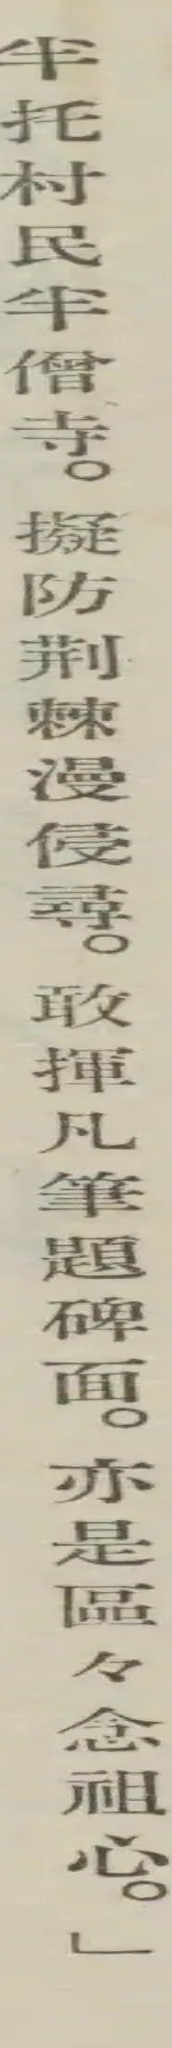半托村民半僧寺。擬防荊棘漫侵尋。敢揮凡筆題碑面。亦是区々念祖心。」
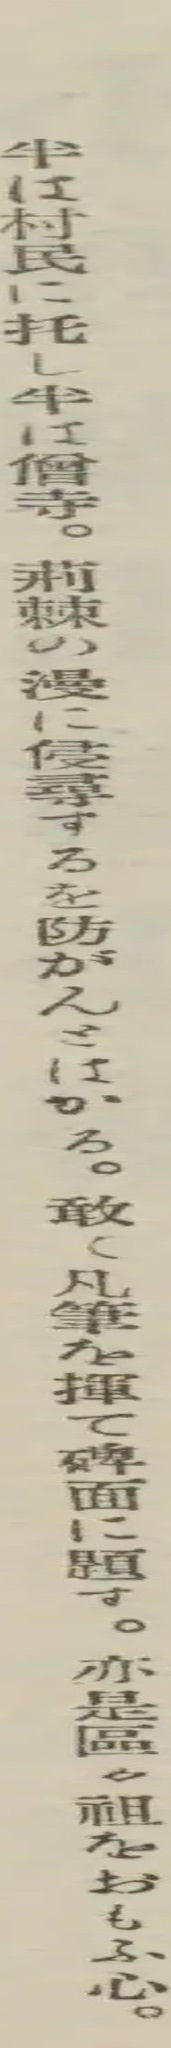半は村民に托し半は僧寺。荊棘の漫に侵尋するを防がんとはかる。敢て凡筆を揮て碑面に題す。亦是区々祖をおもふ心。
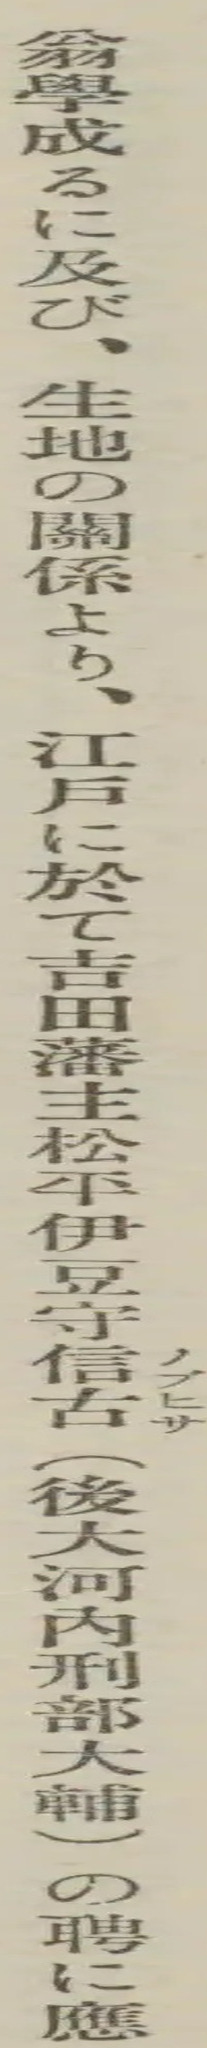翁学成るにと及び、生地の関係より、江戸に於て吉田藩主松平伊豆守信古(後大河内刑部大輔)の聘に応
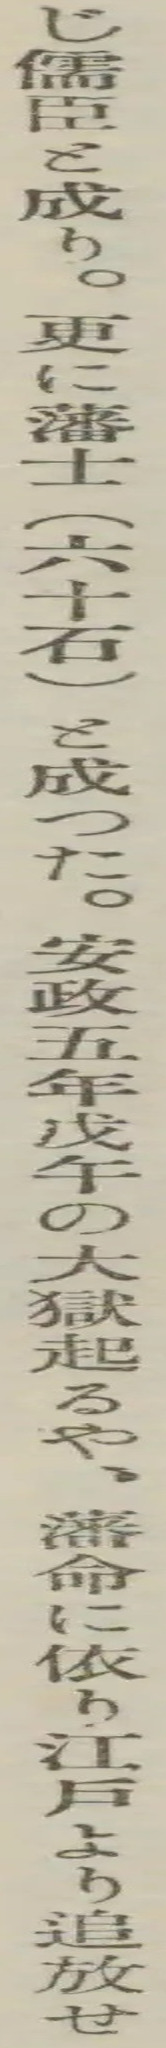じ儒臣と成り。更に藩士(六十石)と成つた。安政五年戊午の大獄起るや、藩命に依り江戸より追放せ
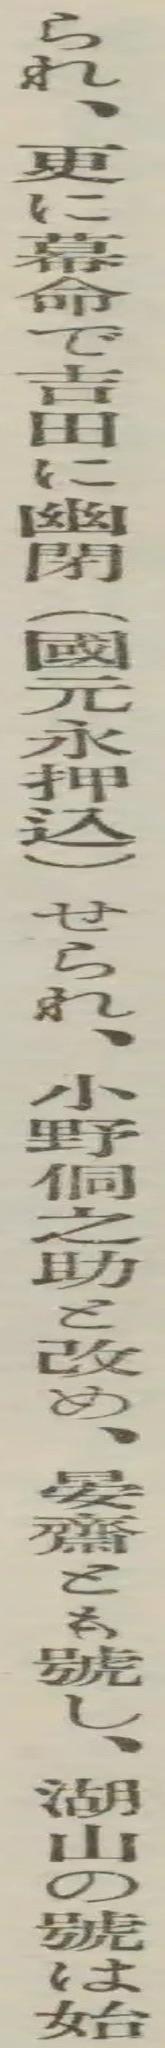られ、更に幕命で吉田に幽閉(国元永押込)せられ、小野侗之助と改め、晏齋とも号し、湖山の号は始
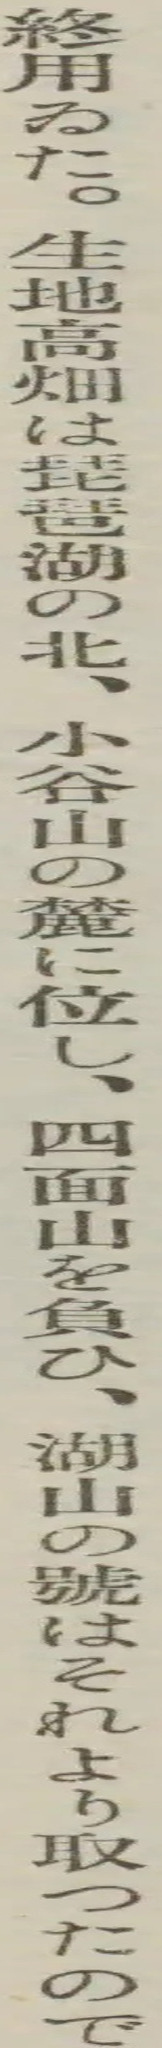終用ゐた。生地高畑は琵琶湖の北、小谷山の麓に位し、四面山を負ひ、湖山の号はそれより取つたので
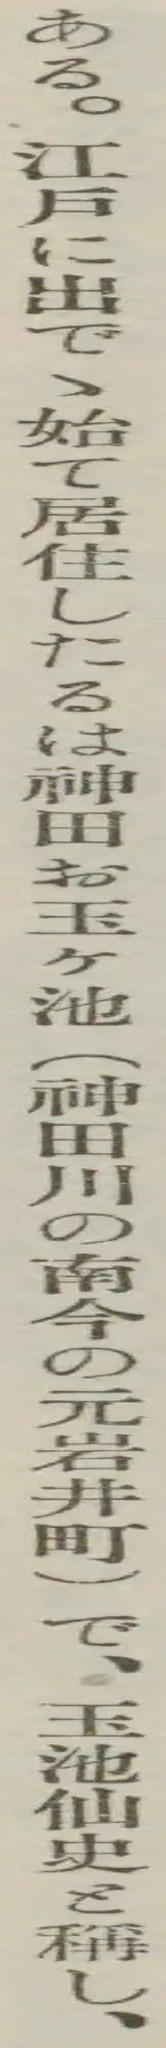ある。江戸に出でゝ始て居住したるは神田お玉ケ池(神田川の南今の元岩井町)で、玉池仙史と称し、
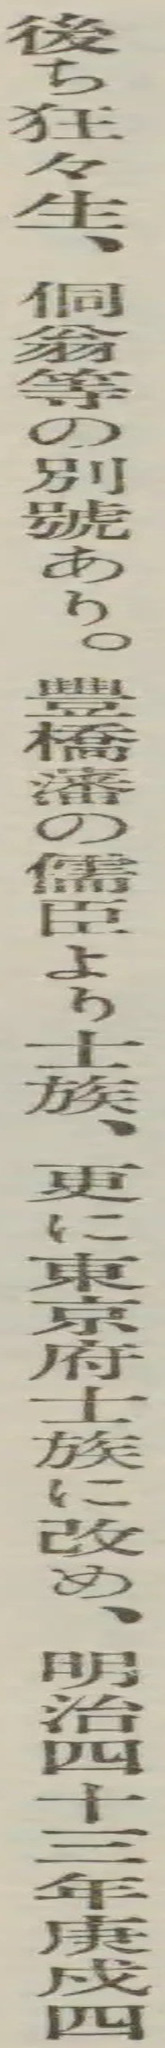後ち狂々生、侗翁等の別号あり。豊橋藩の儒臣より士族、更に東京府士族に改め、明治四十三年庚戌四
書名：小野湖山翁小伝
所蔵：国立国会図書館 National Diet Library, JAPAN
